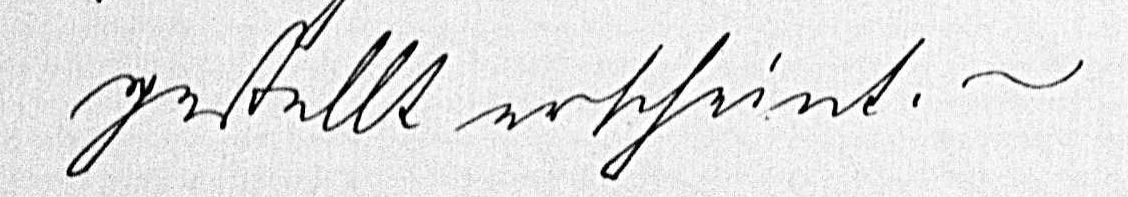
gestellt erscheint.
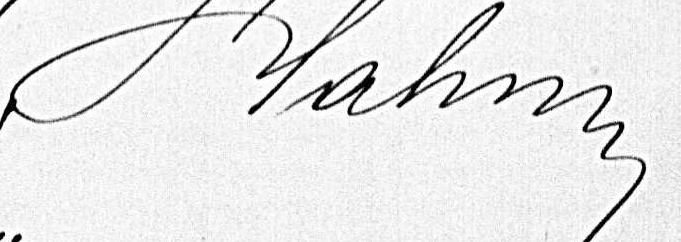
Hahn
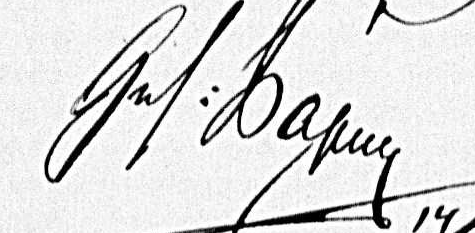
Graf Banny
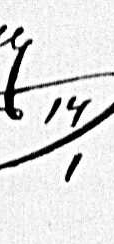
14/1
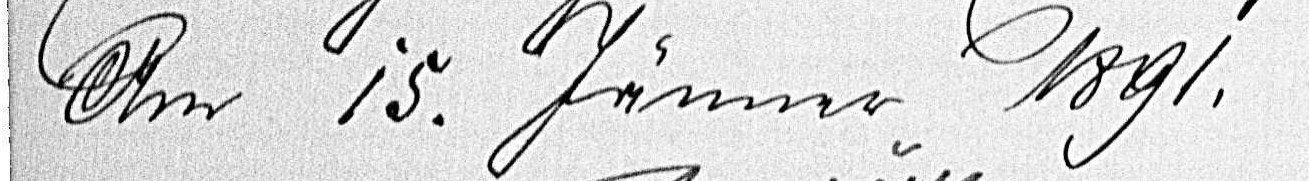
Am 15. Jänner 1891
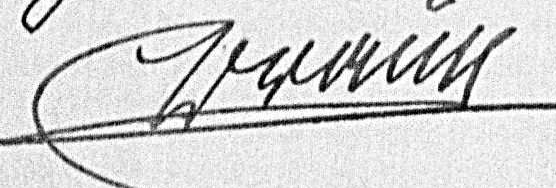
Braun
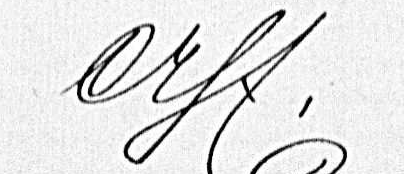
AhE.
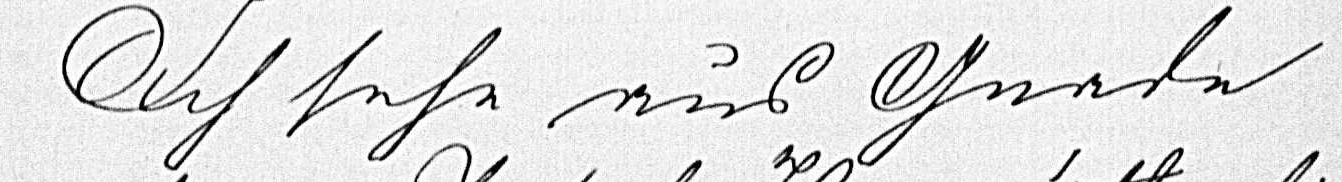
Ich sehe aus Gnade
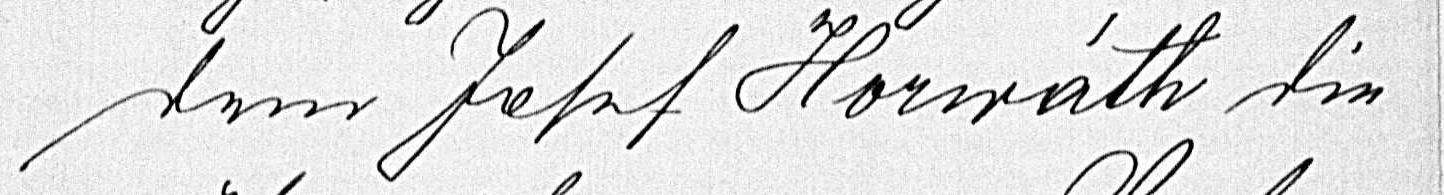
dem Josef Horwáth die
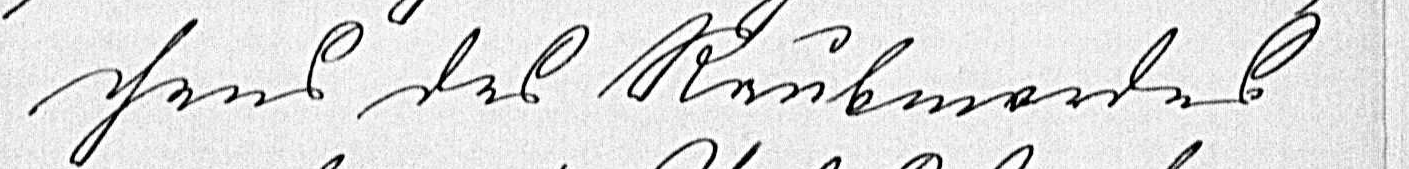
chens Raubmordes
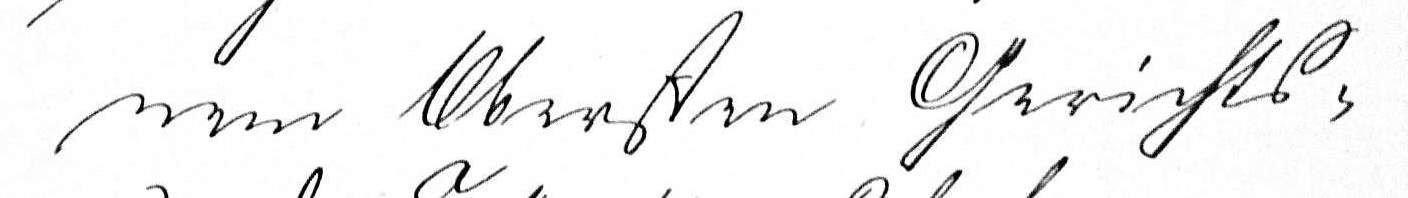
nem Obersten Gerichts-
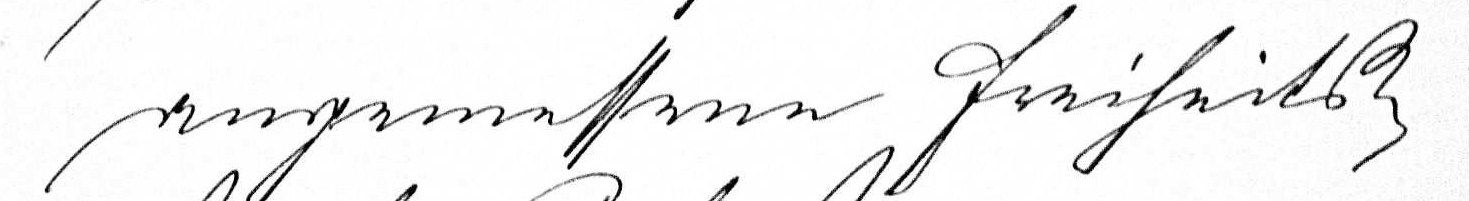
angemessenen Freiheits¬
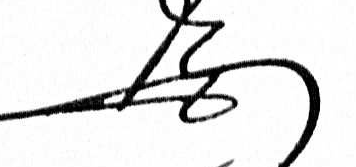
FJ
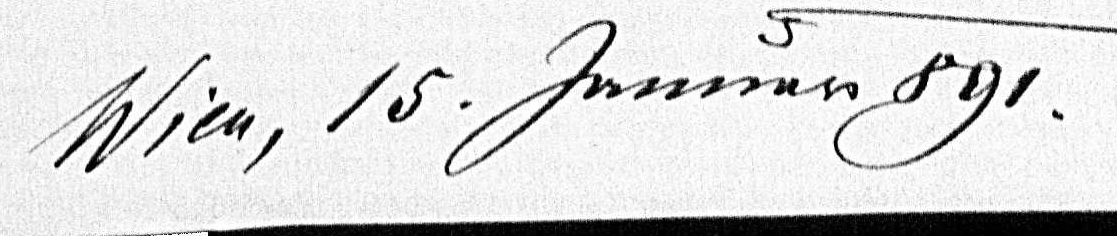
Wien, 15. Jänner 1891
